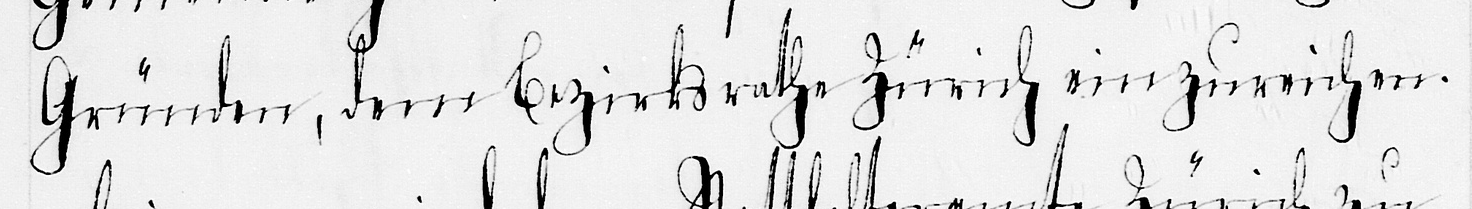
Gründen, dem Bezirksrathe Zürich einzureichen.
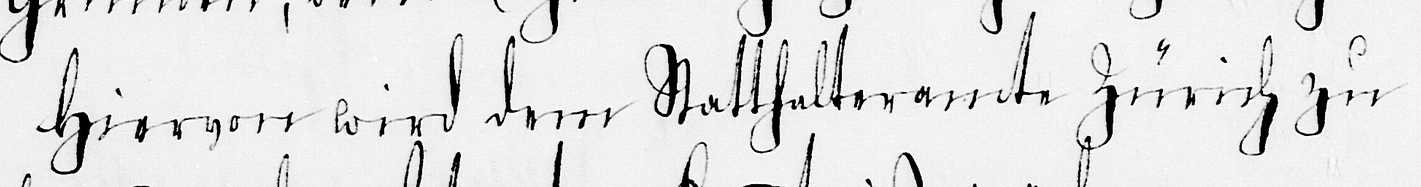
Hiervon wird dem Statthalteramte Zürich zu
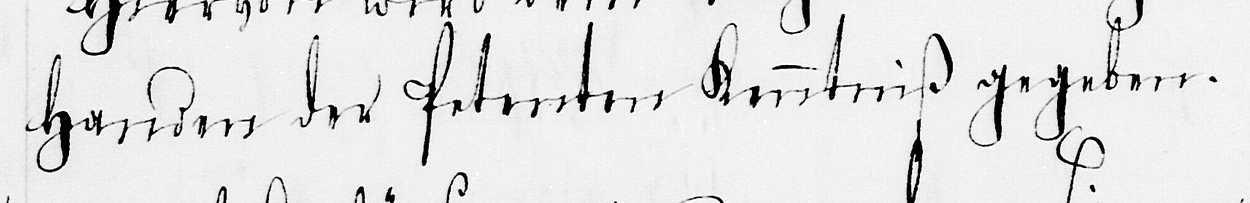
Handen der Petenten Kenntniß gegeben.
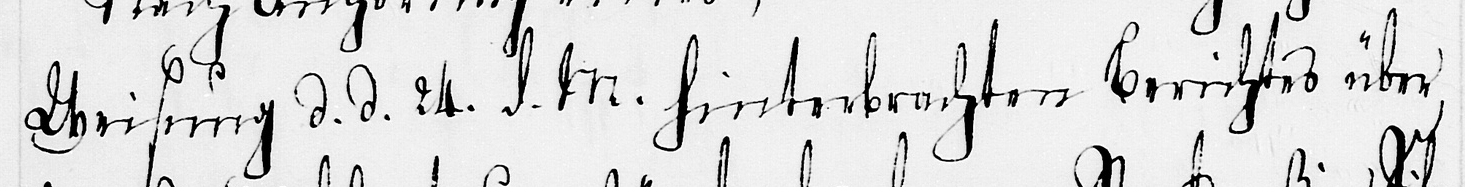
Weisung d. d. 24. d. M. hinterbrachten Berichtes über
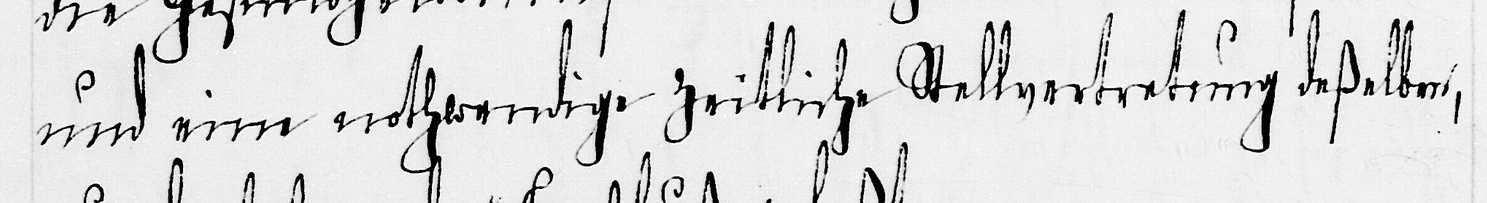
und eine nothwendige zeitliche Stellvertretung deßelben,
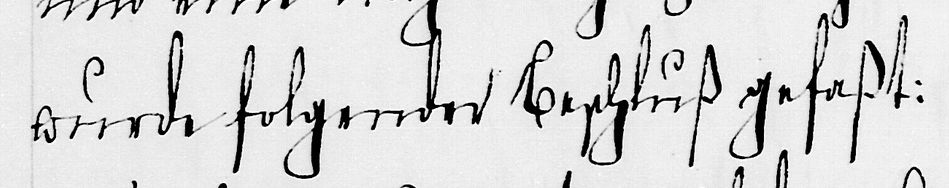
wurde folgender Beschluß gefaßt:
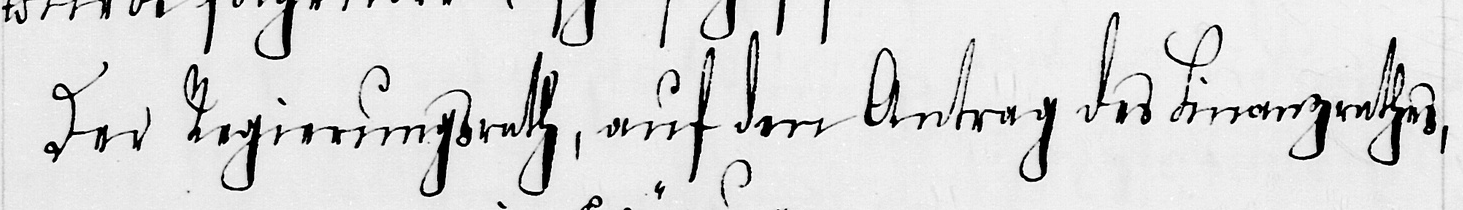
Der Regierungsrath, auf den Antrag des Finanzrathe¬
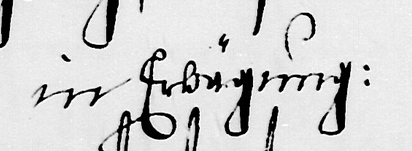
in Erwägung:
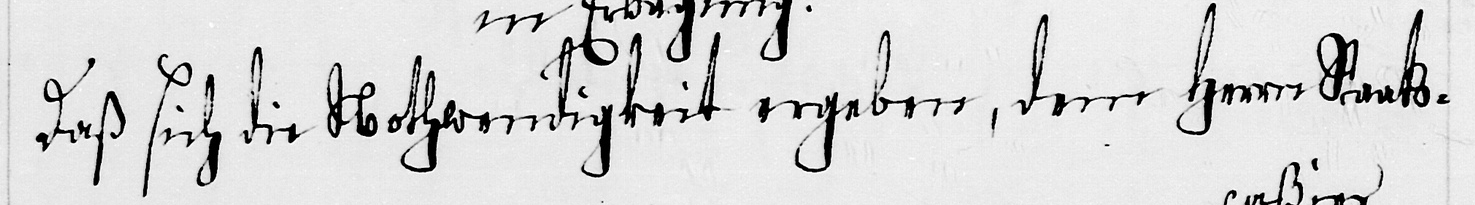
Daß sich die Nothwendigkeit ergeben, dem Herrn Staats-
